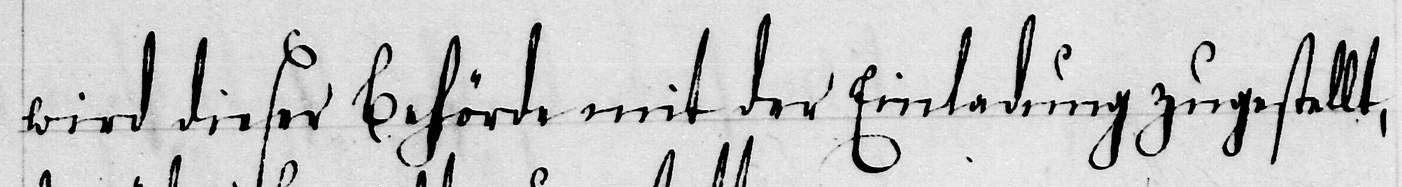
wird dieser Behörde mit der Einladung zugestellt
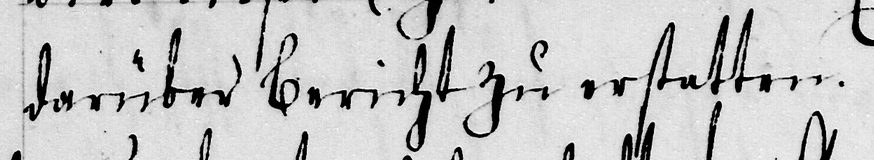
darüber Bericht zu erstatten.
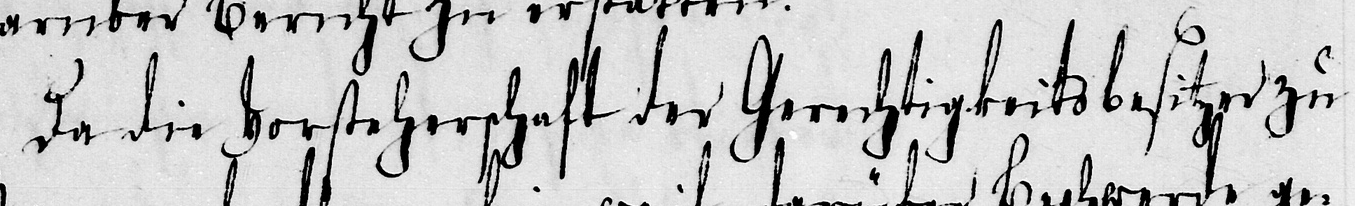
Da die Vorsteherschaft der Gerechtigkeitsbesitzer zu
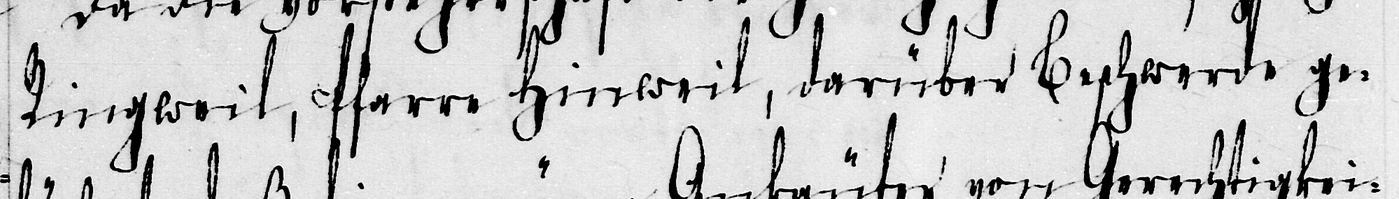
Ringweil, Pfarre Hinweil, darüber Beschwerde ge¬
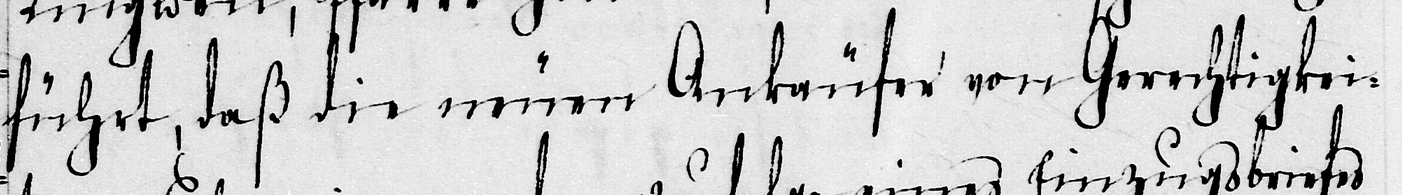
führt, daß die neuen Ankäufer von Gerechtigkei¬
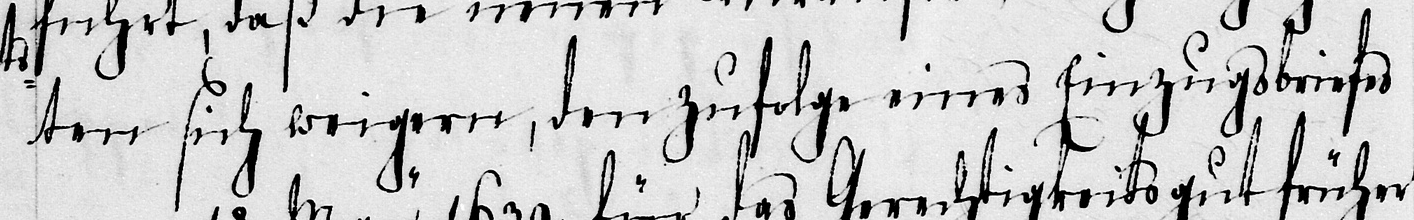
ten sich weigern, den zufolge eines Einzugsbriefes
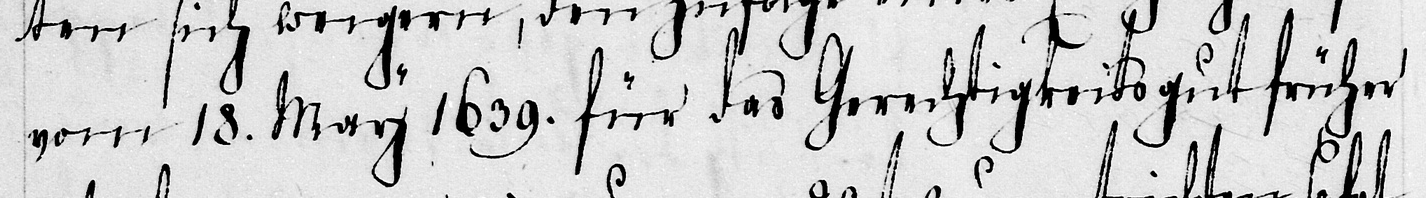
vom 18. May 1639. für das Gerechtigkeitsgut früher
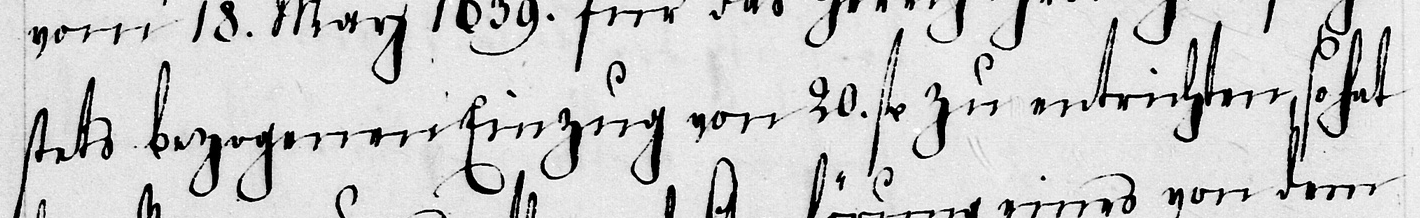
stets bezogenen Einzug von 20. fl. zu entrichten, so hat
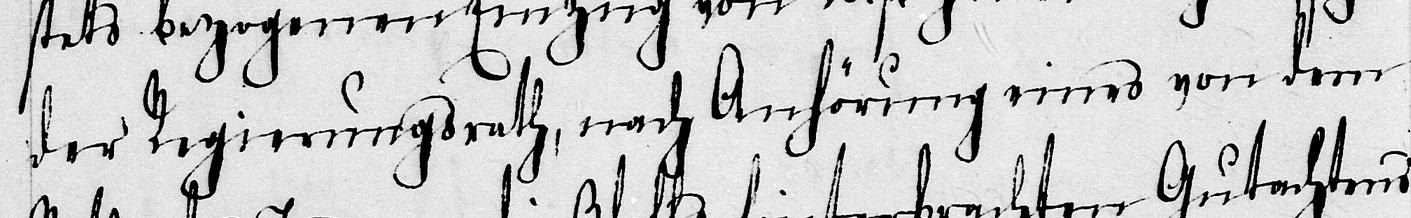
der Regierungsrath, nach Anhörung eines von dem
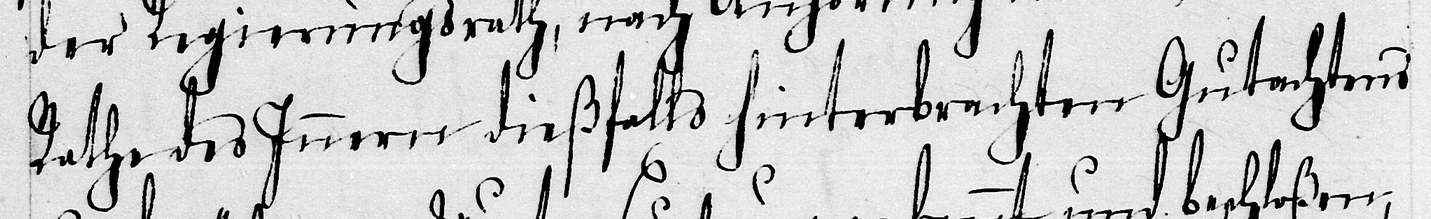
Rathe des Innern dießfalls hinterbrachten Gutachtens
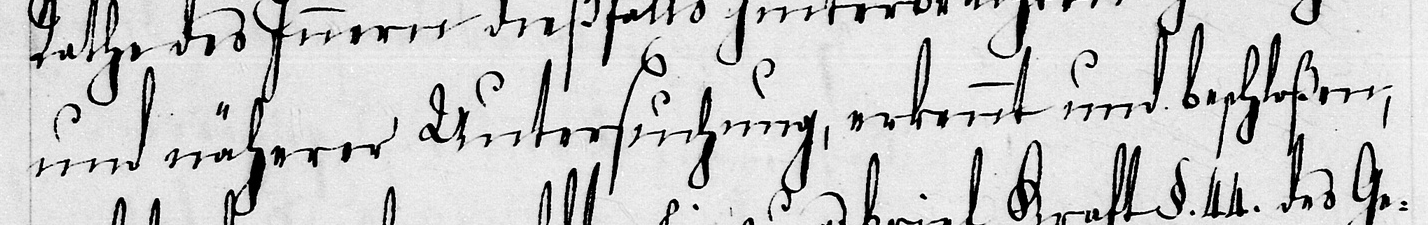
und näherer Unterstützung, erkennt und beschloßen,
